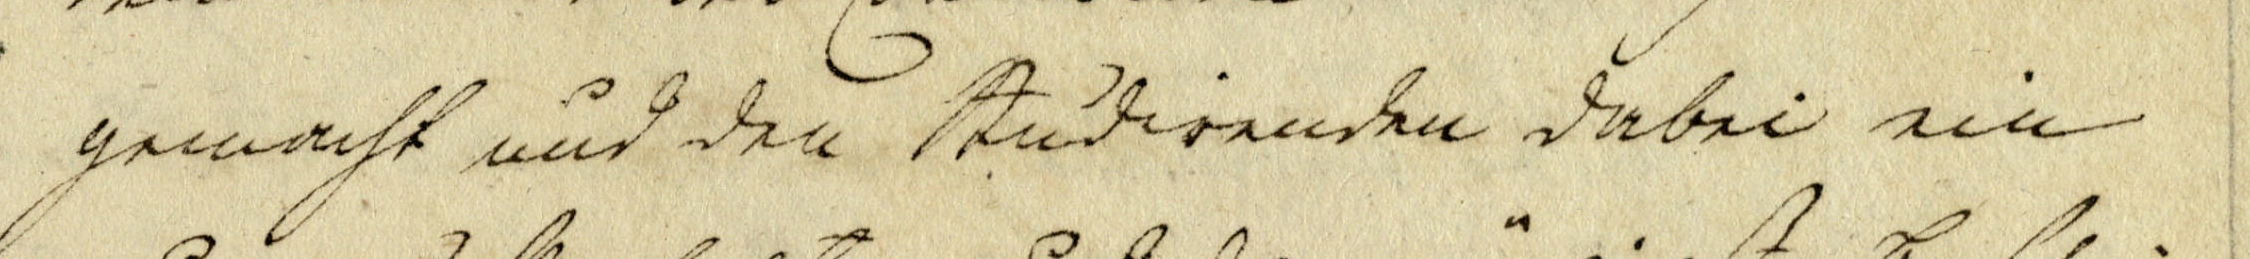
gemacht und den Studirenden dabei ein
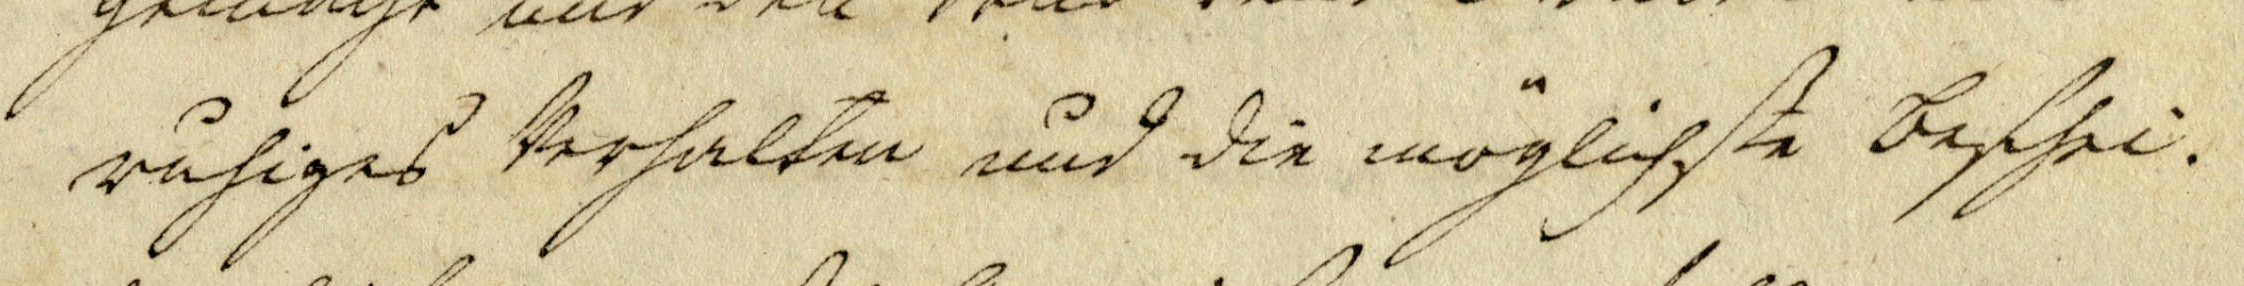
ruhiges Verhalten und die möglichste Beschei¬
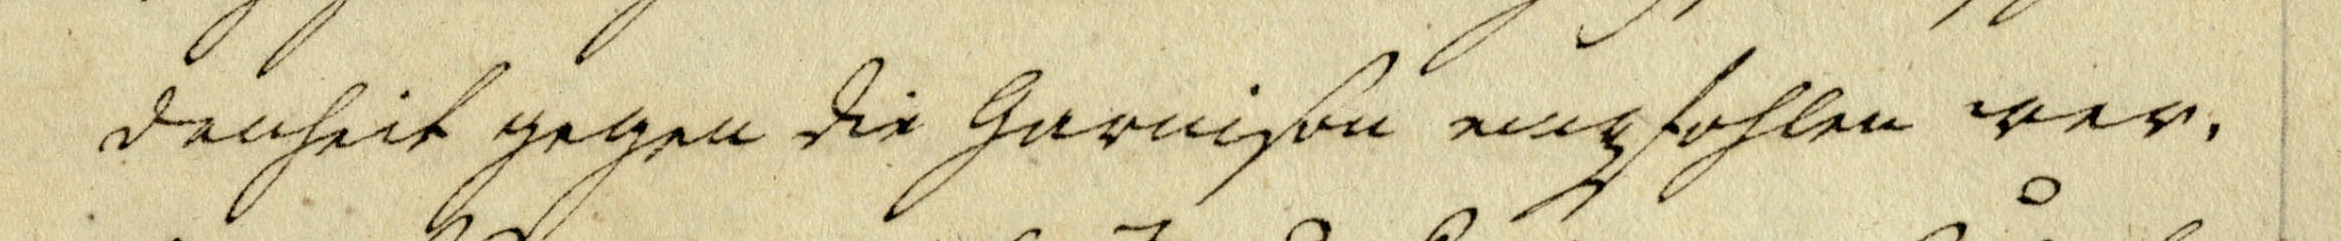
denheit gegen die Garnison empfohlen wer¬
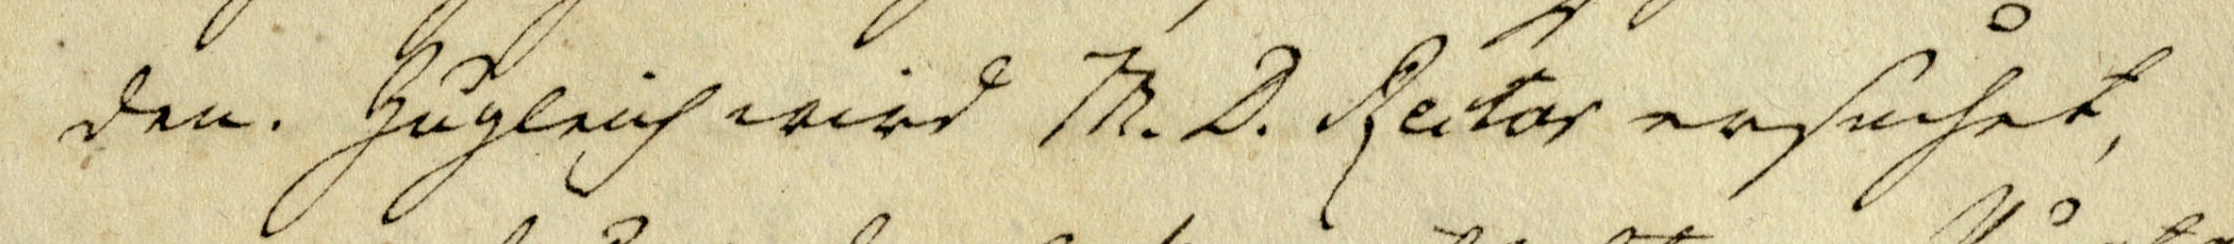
den. Zugleich wird M. D. Rector ersuchet,
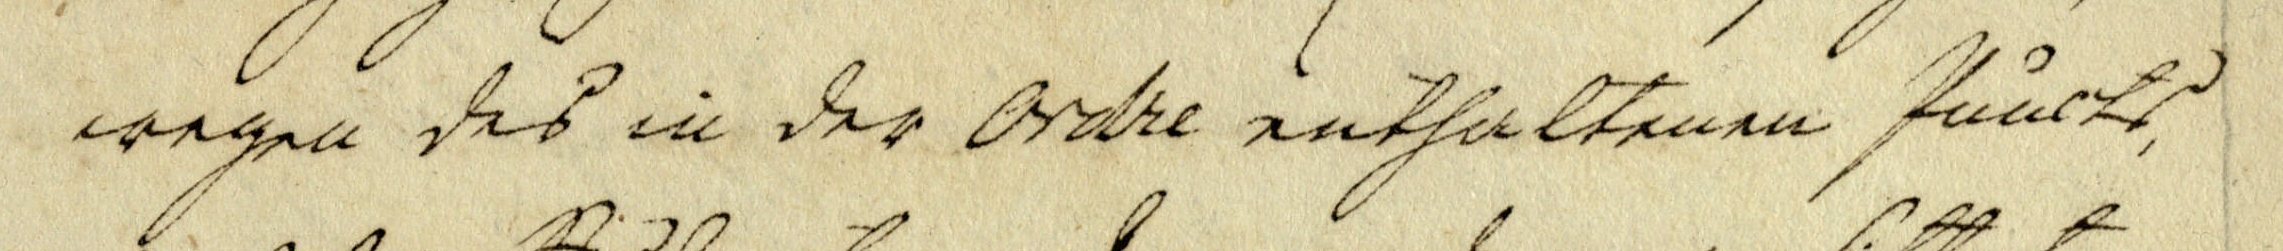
wegen des in der Ordre enthaltenen Puncts,
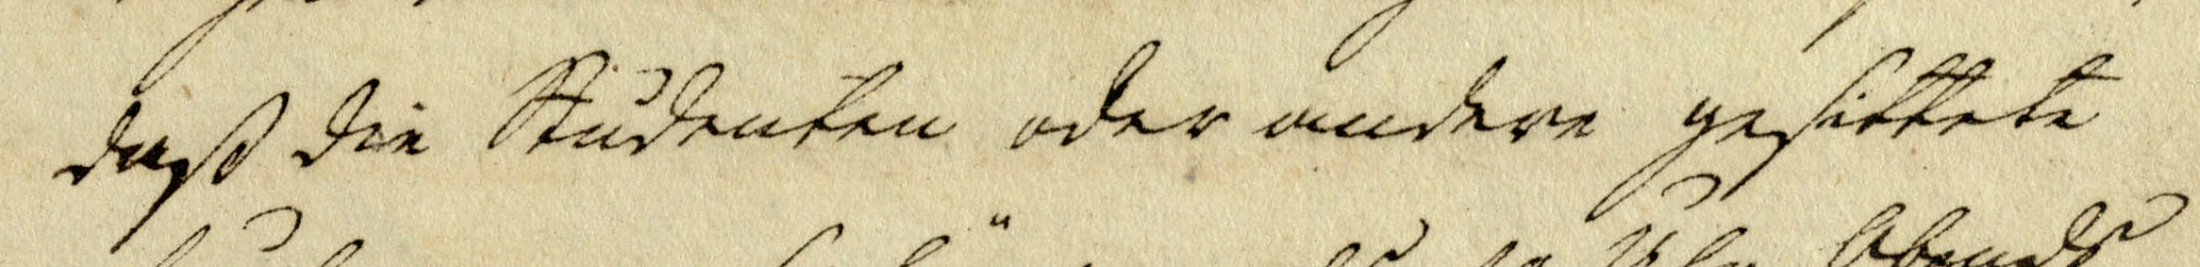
daß die Studenten oder andere gesittete
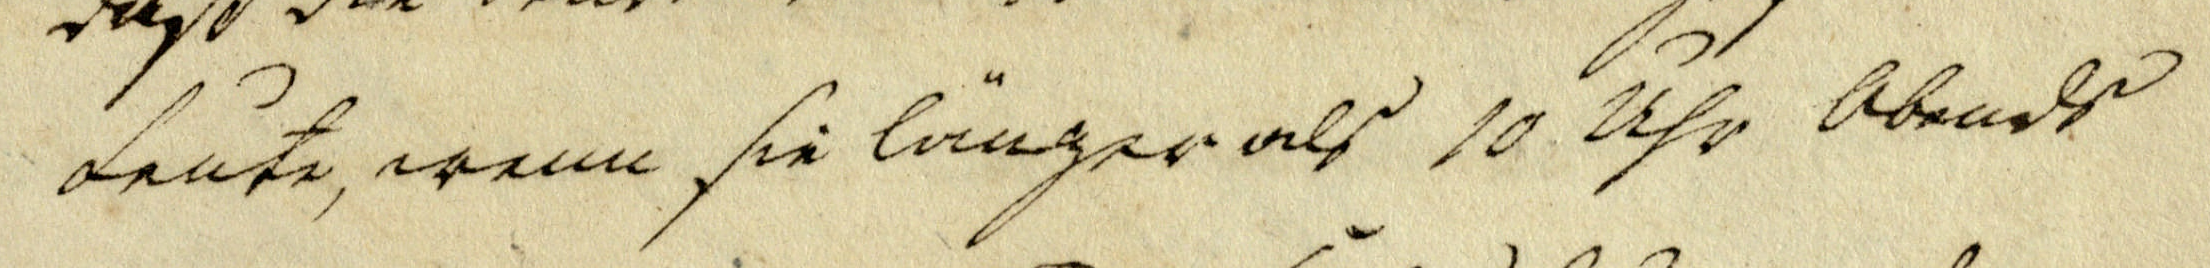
Leute, wenn sie länger als 10 Uhr Abends
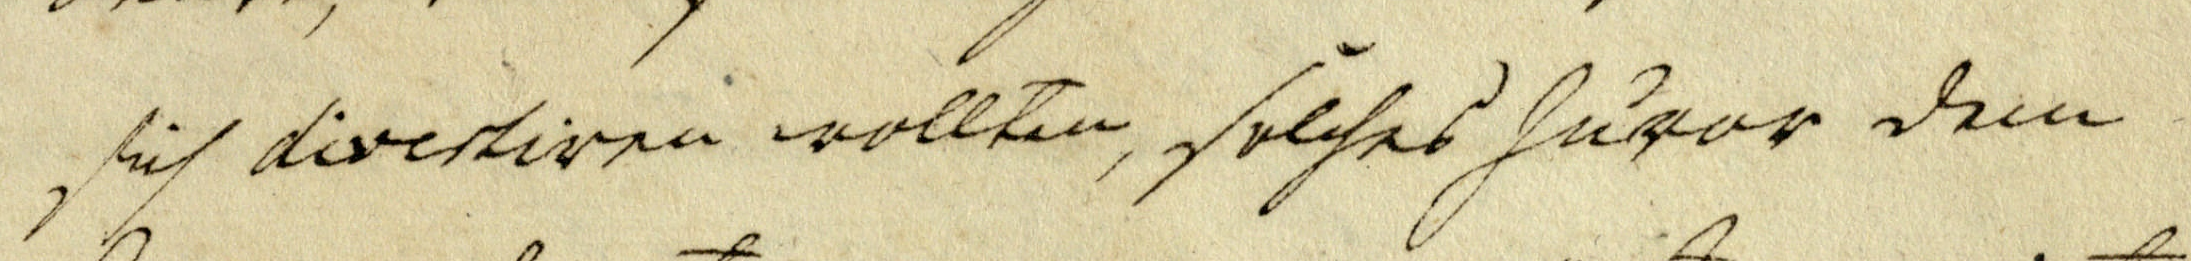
sich divertiren wollten, solches zuvor dem
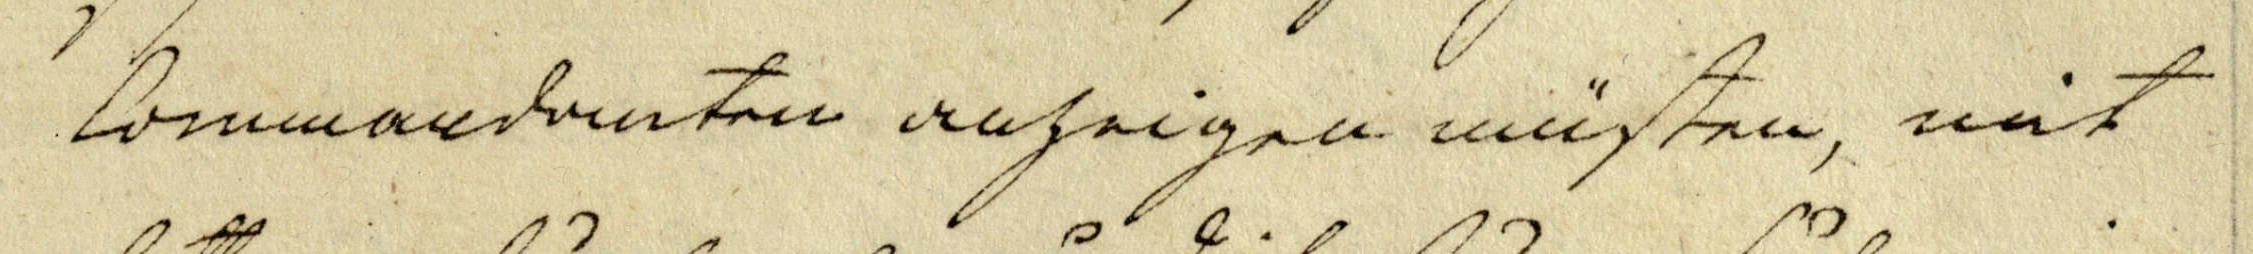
Commandaten anzeigen müsten, mit
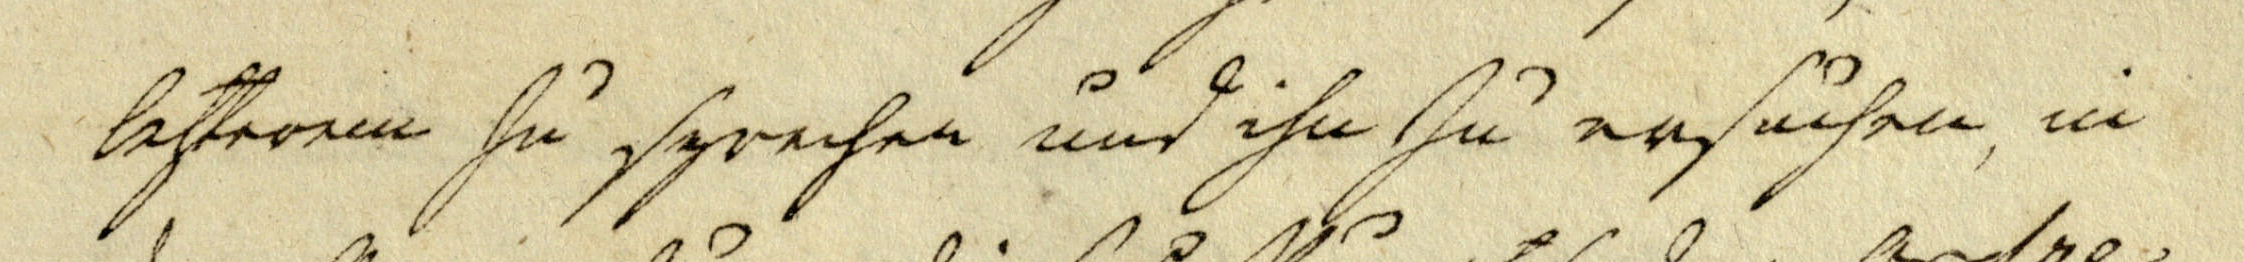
letzterem zu sprechen und ihn zu ersuchen, in
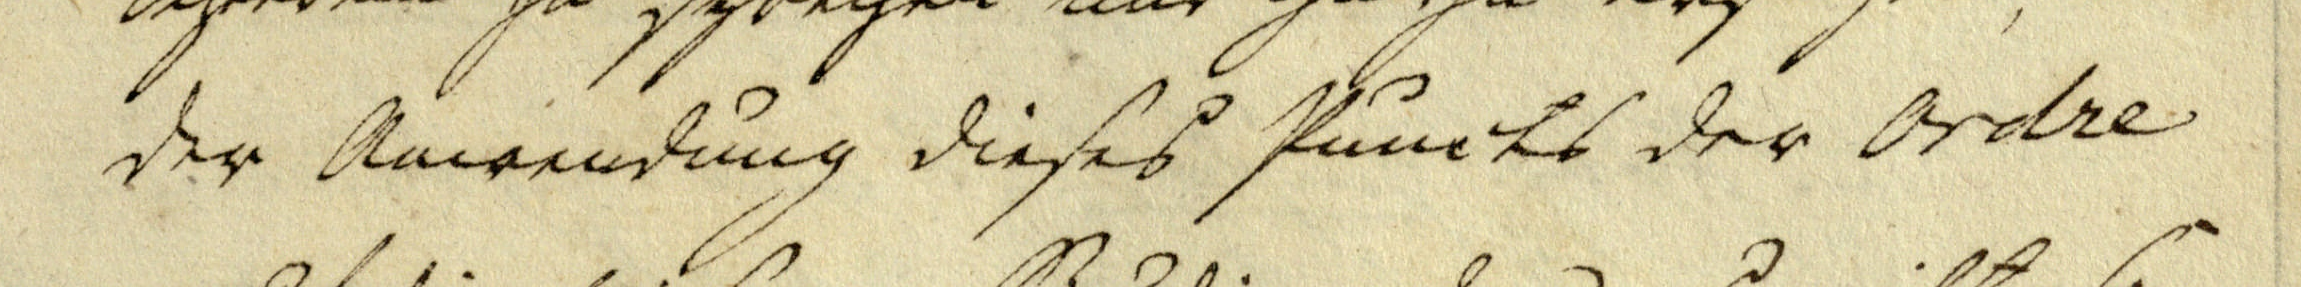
der Abwendung dieses Puncts der Ordre
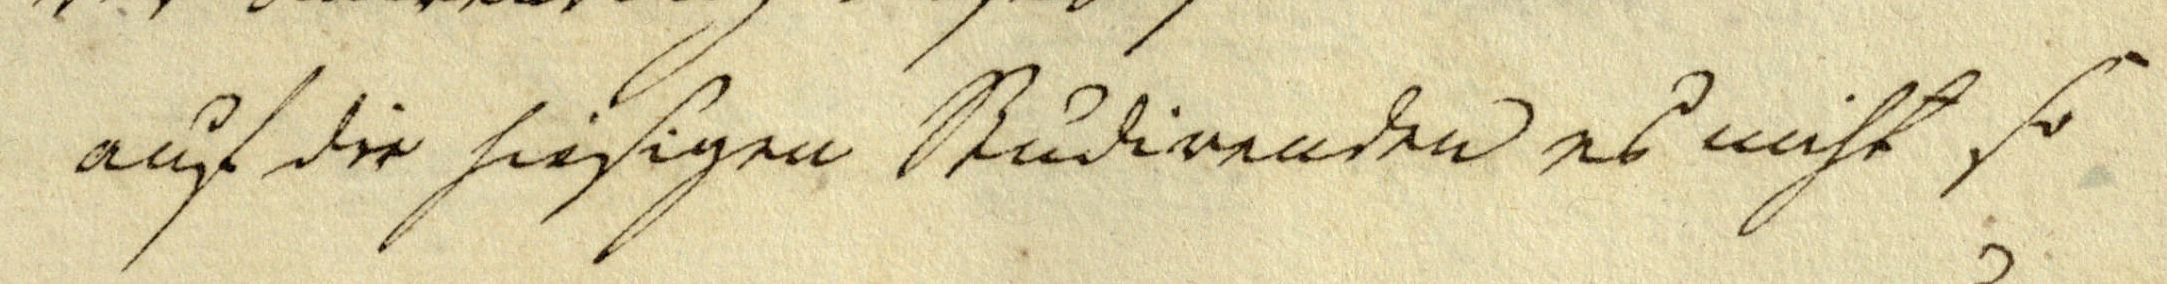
auf die hiesigen Studirenden es nicht so
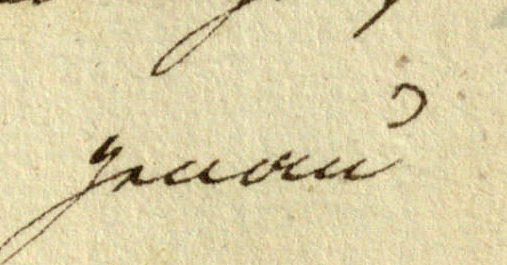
genau
